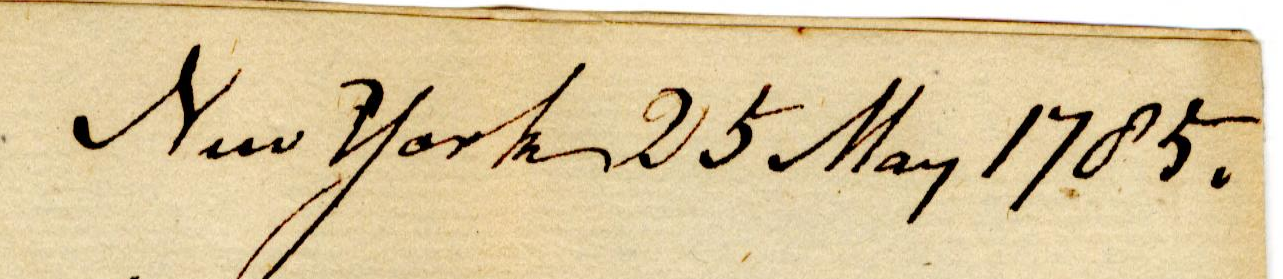New York 25 May 1785.
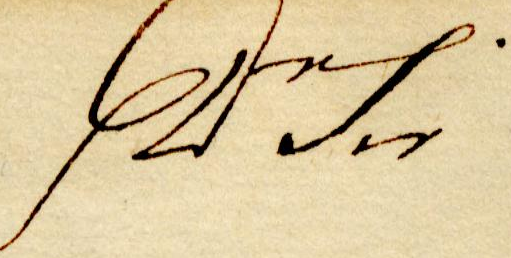D^r. Sir
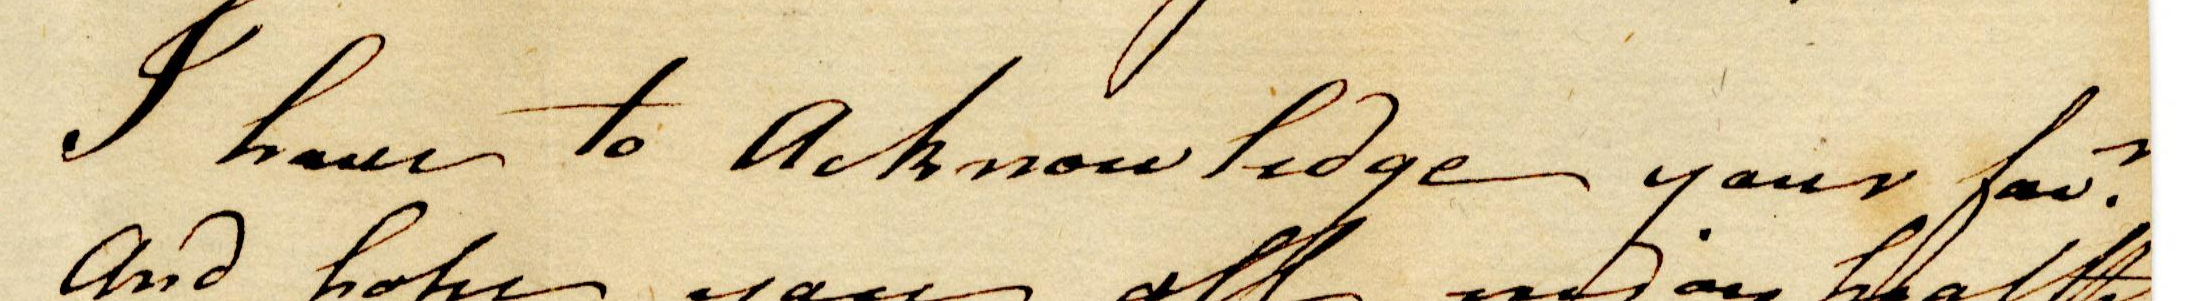I have to acknowledge your fav^r.
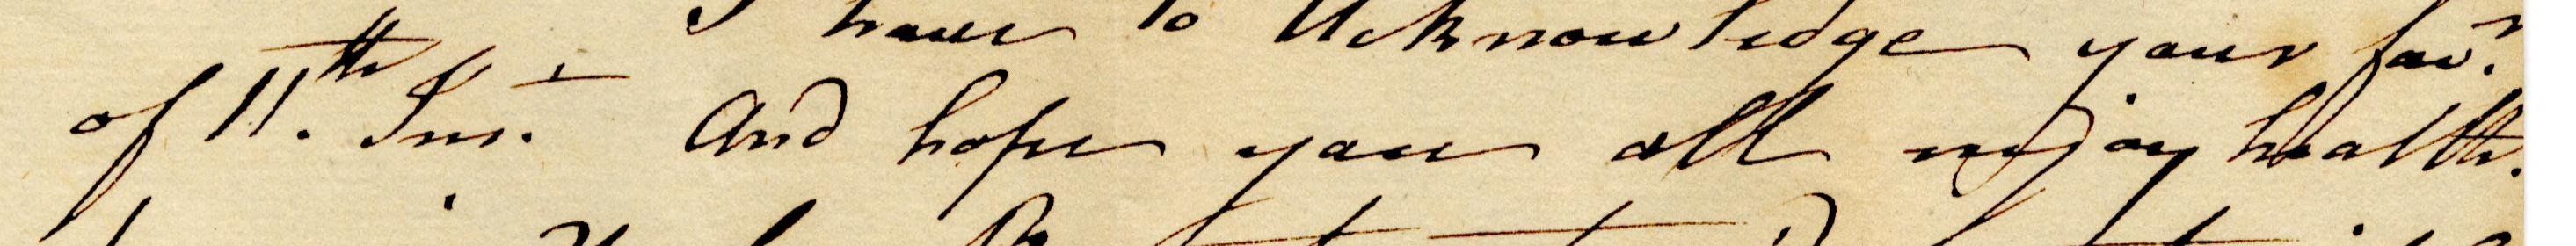of 11^th. Ins^t. and hope you all enjoy health
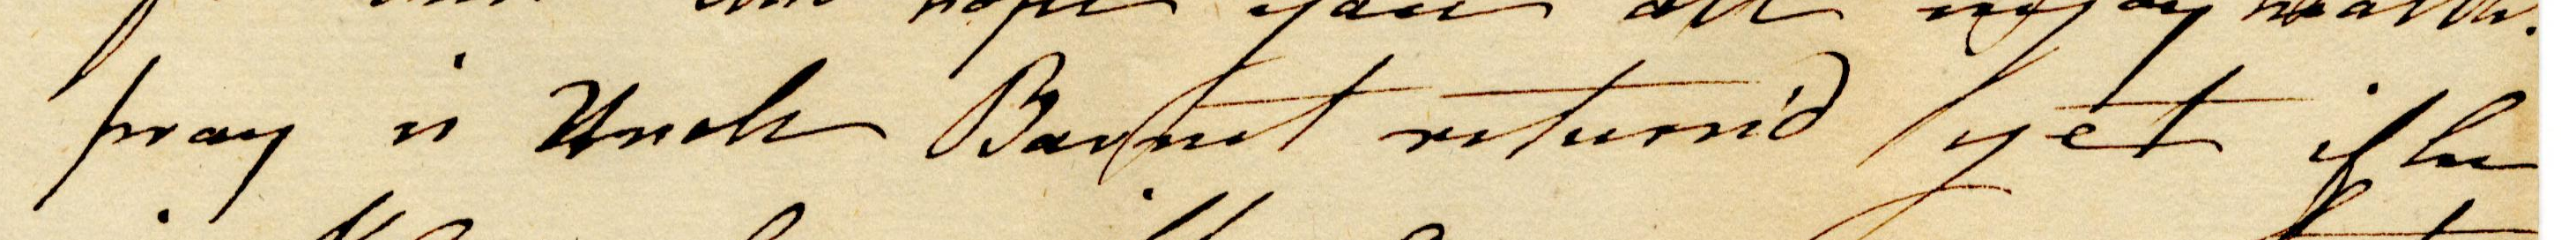pray is Uncle Barnard return'd yet if he
